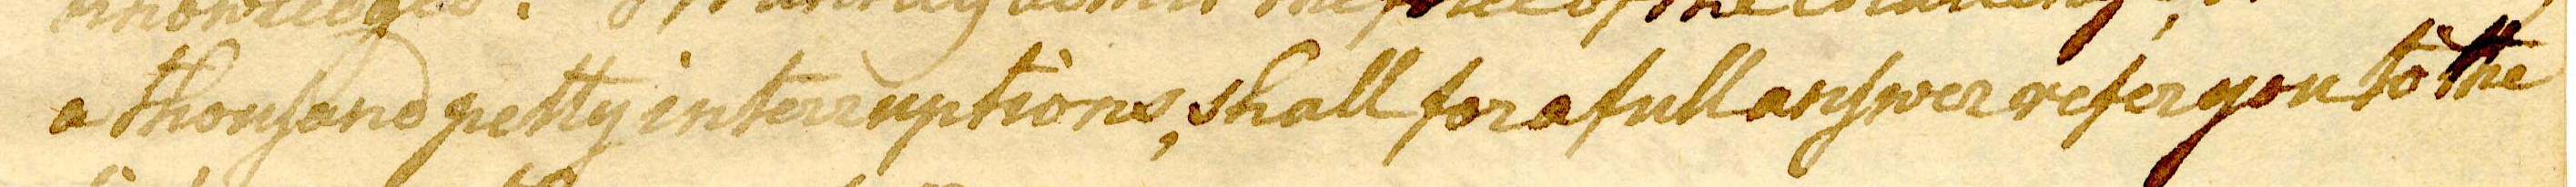a thousand petty interruptions, shall for a full answer refer you to the
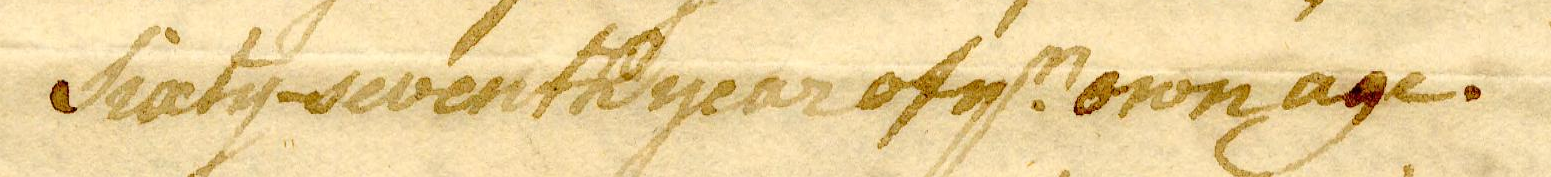Sixty-seventh year of y^r. own age.
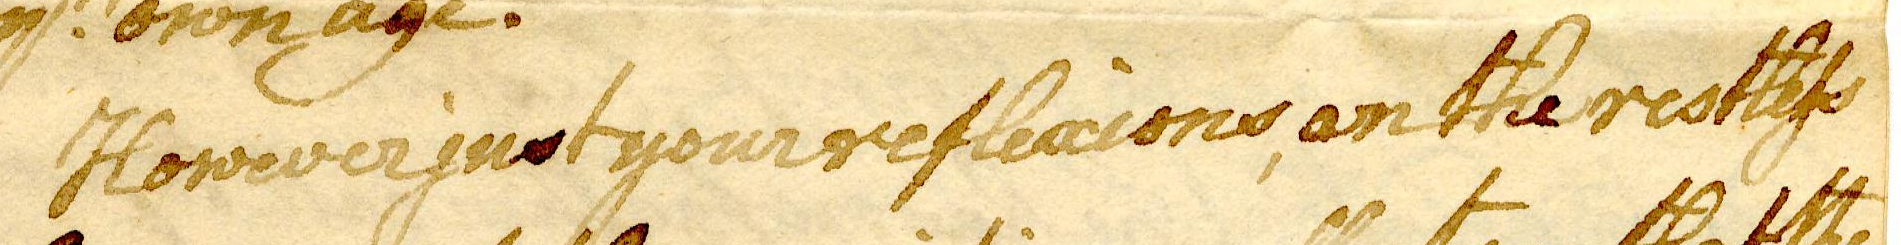However just your reflexions, or the restless
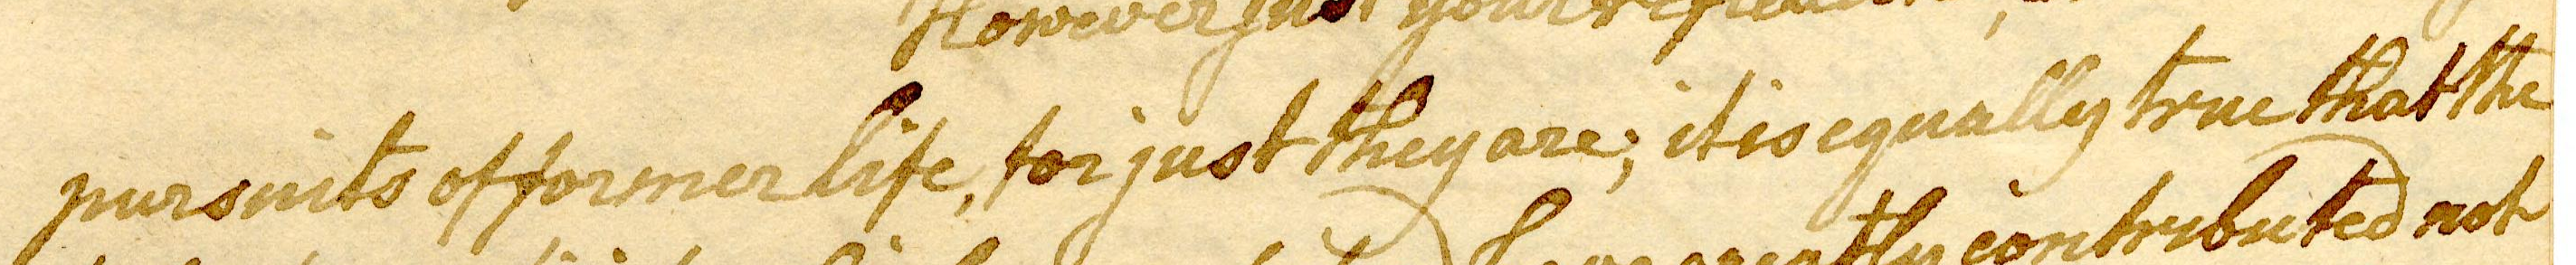pursuits of former life, for just they are; it is equally true that the
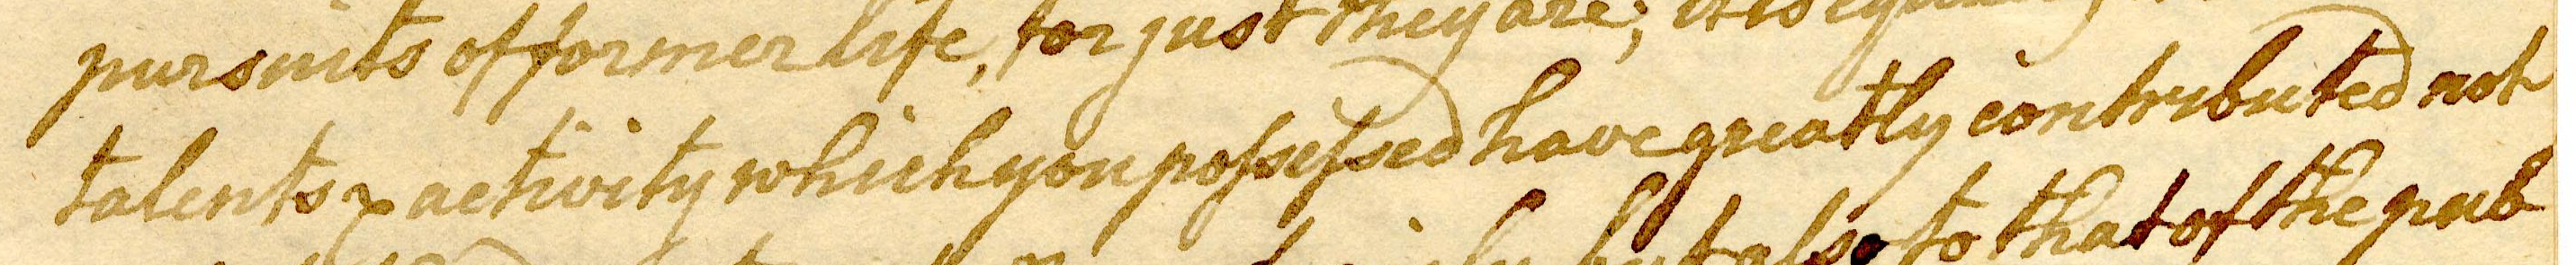talents & activity which you possessed have greatly contributed not
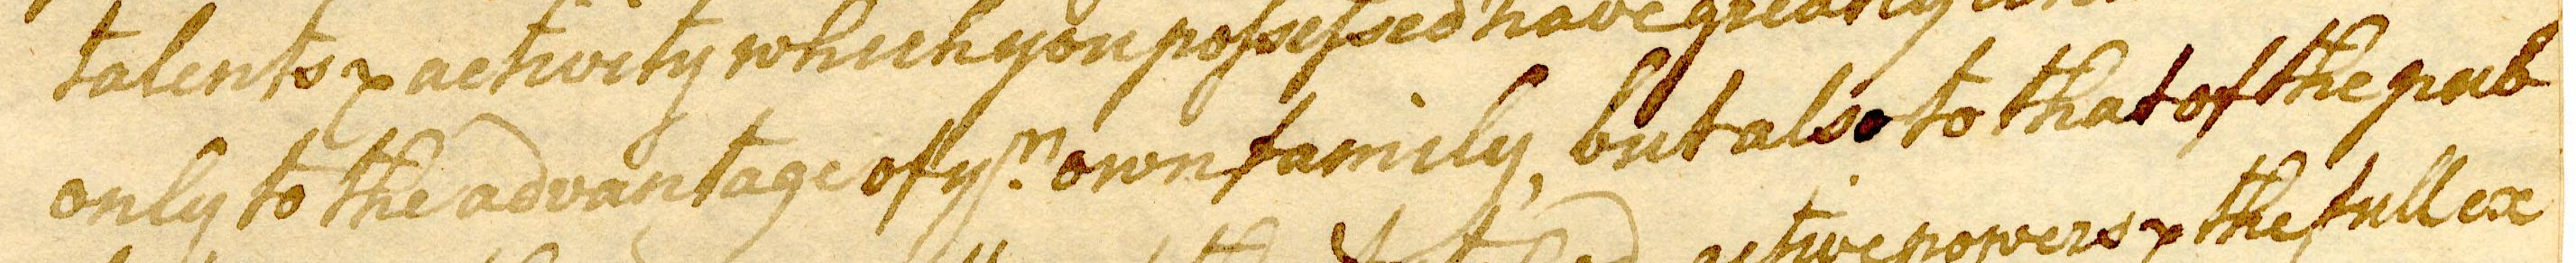only to the advantage of y^r. own family, but also to that of the pub
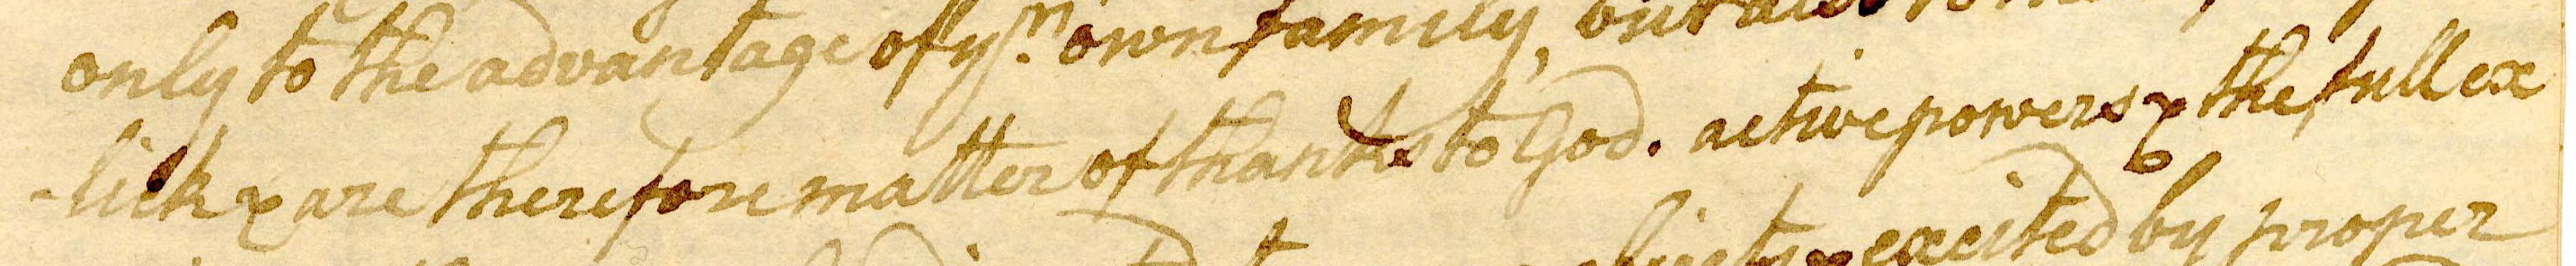-lick are therefore matter of thanks to God. active powers & the full ex
